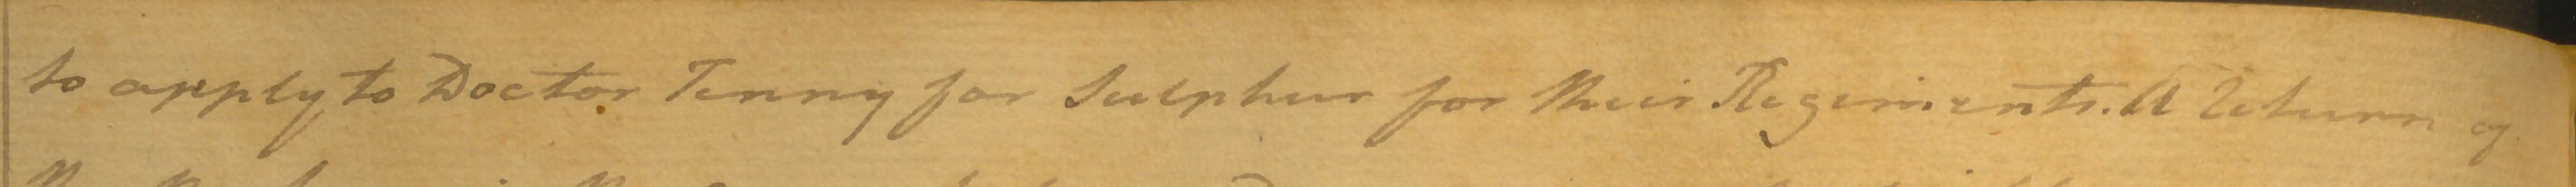to apply to Doctor Tenny for Sulphur for their Regimentall Return of
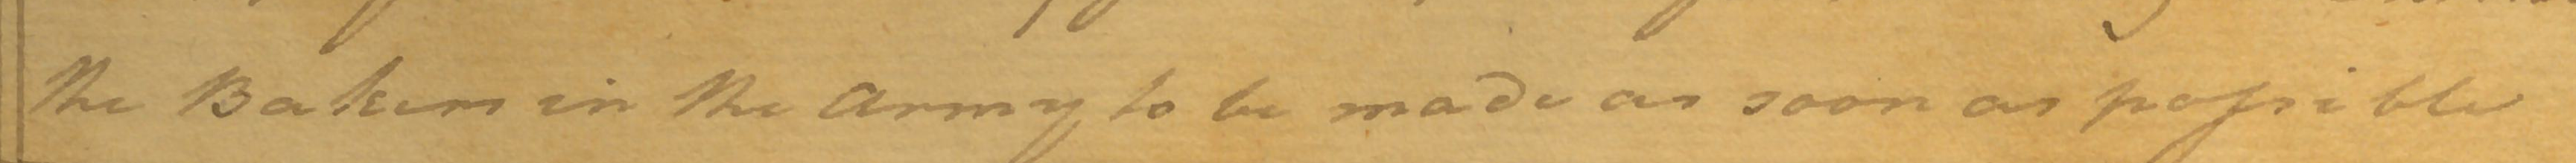the Bakers in the Army to be made as soon as possible
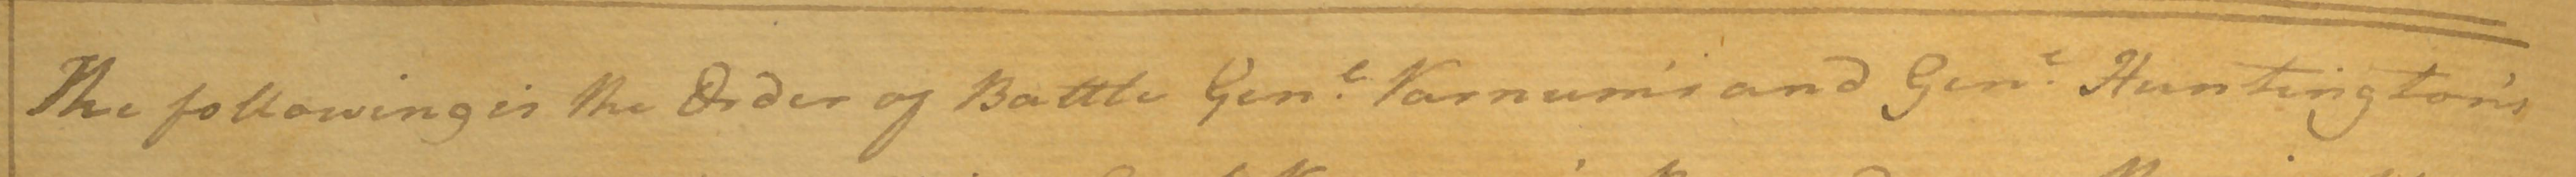The following is the Order of Battle Gen^l. Varnum's and Gen^l. Huntington's
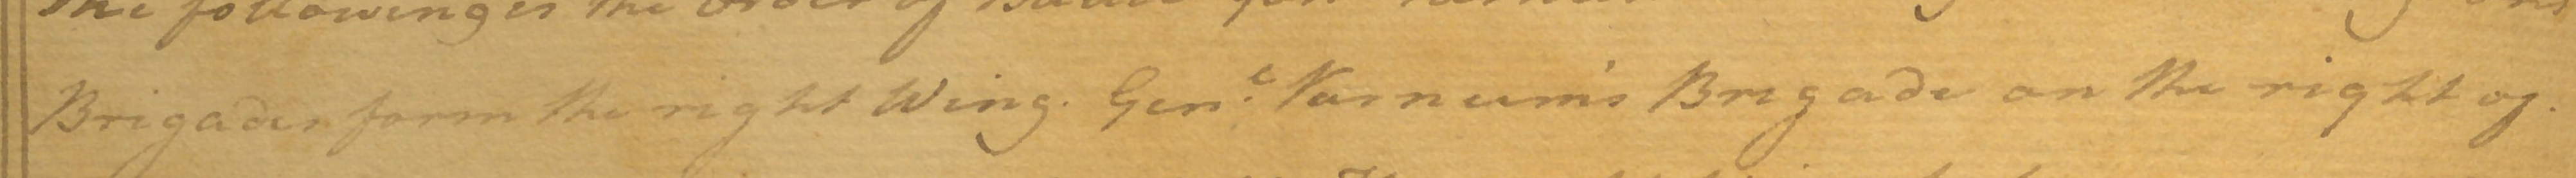Brigade form the right Wing. Gen^l. Varnum's Brigade on the right of
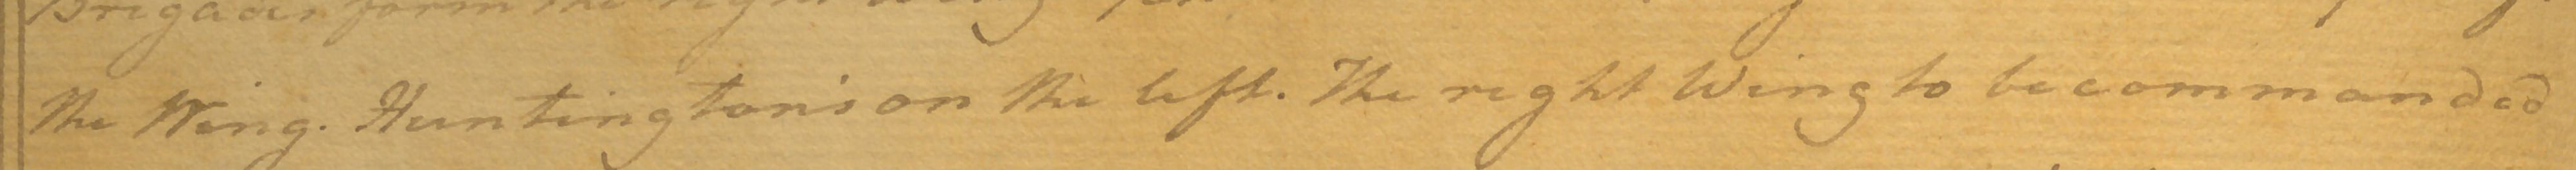the Wing. Huntington's on the left. The right Wing to be commanded
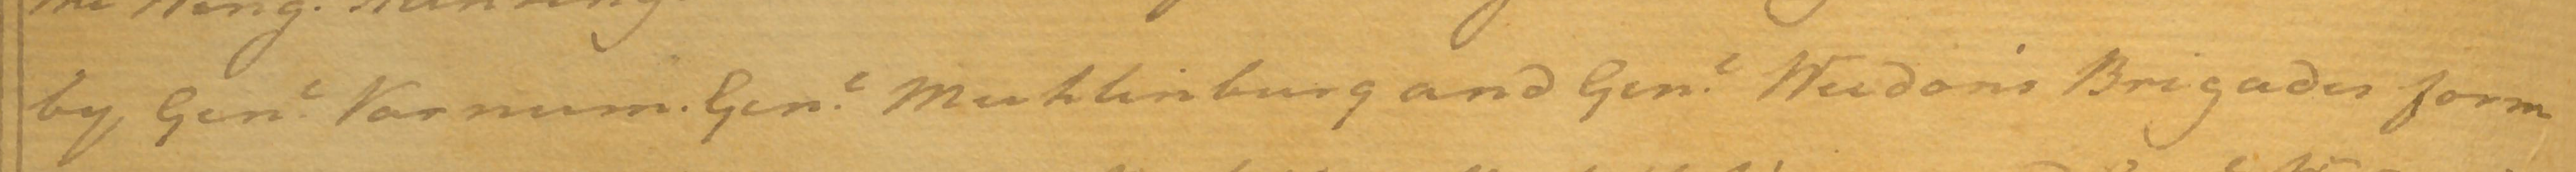by Gen^l. Varnum. Gen^l. Muhlinburg and Gen^l. Weedon's Brigades form
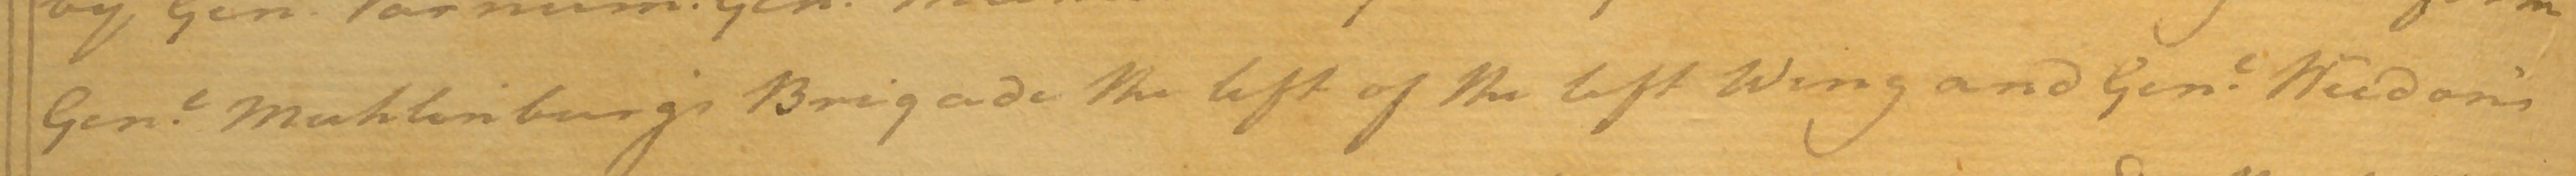Gen^l. Muhlinburg's Brigade the left of the Wing and Gen^l Weedon's
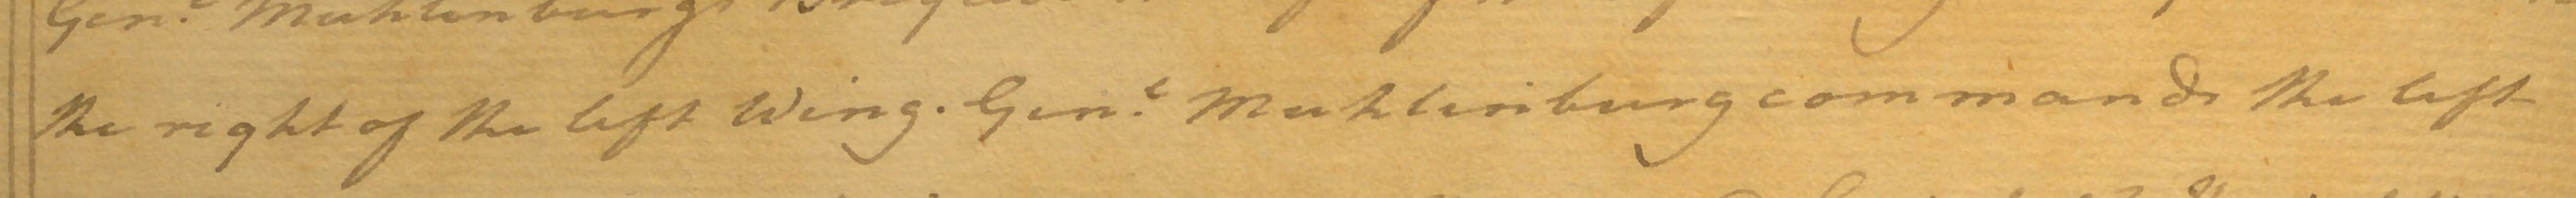the right of the left Wing. Gen^l. Muhlinburg commands the left
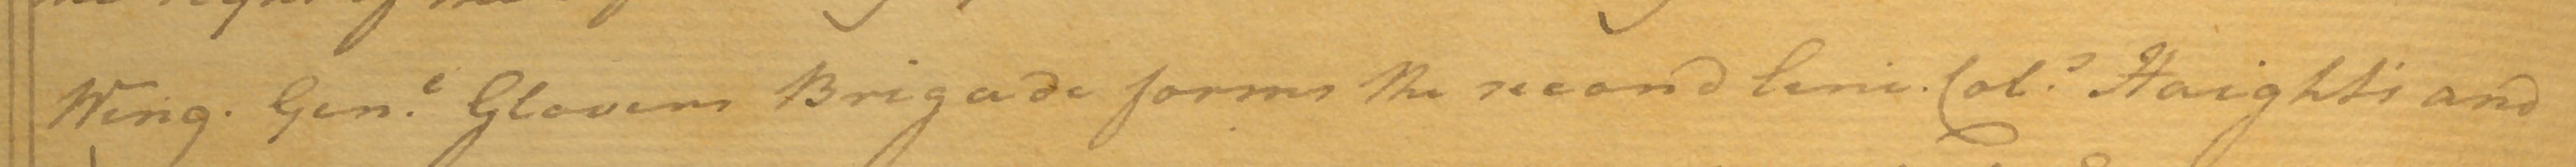Wing. Gen^l. Glovers Brigade forms the second line. Col^o. Haight's and
